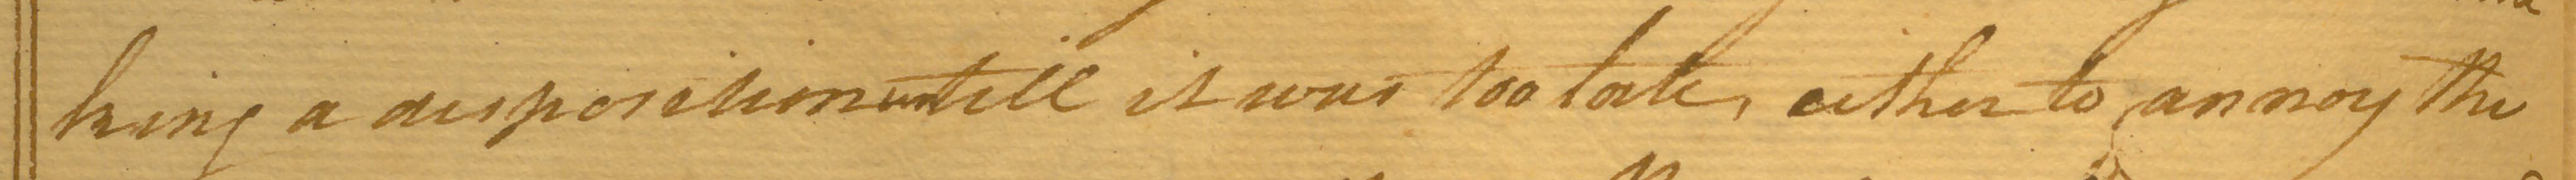king a disposition untill it was too late, either to annoy the
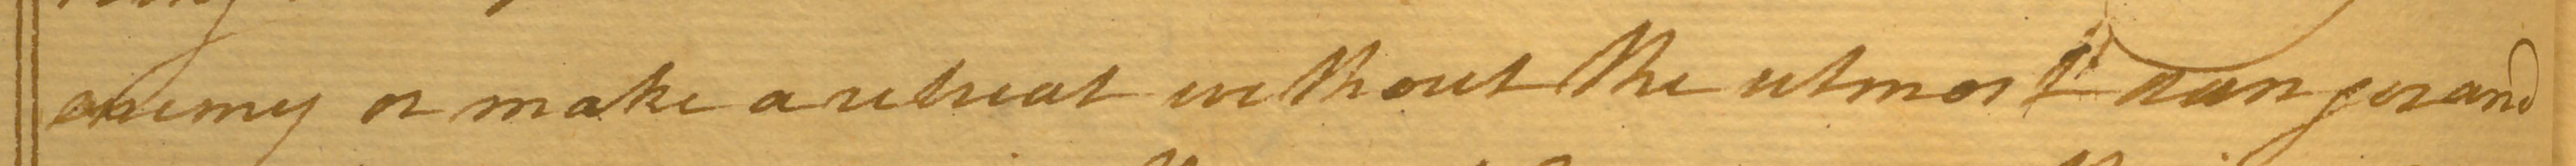enemy or make a retreat without the utmost danger and
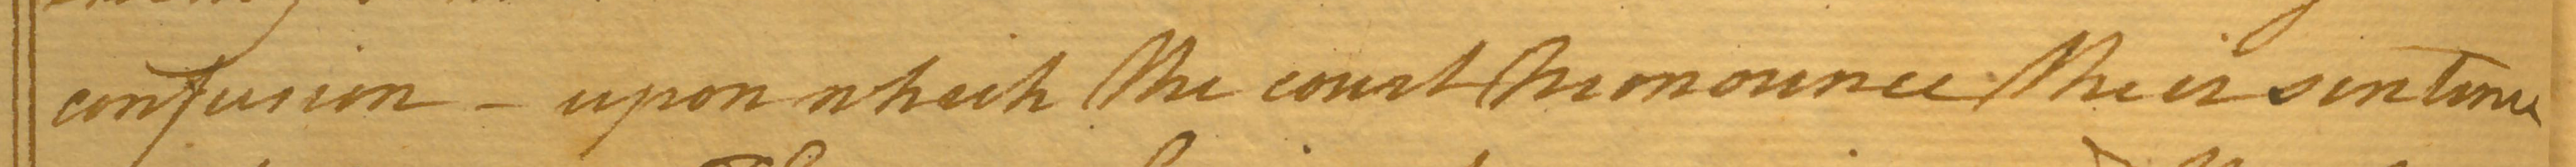confusion- upon which the court pronounce their sentence
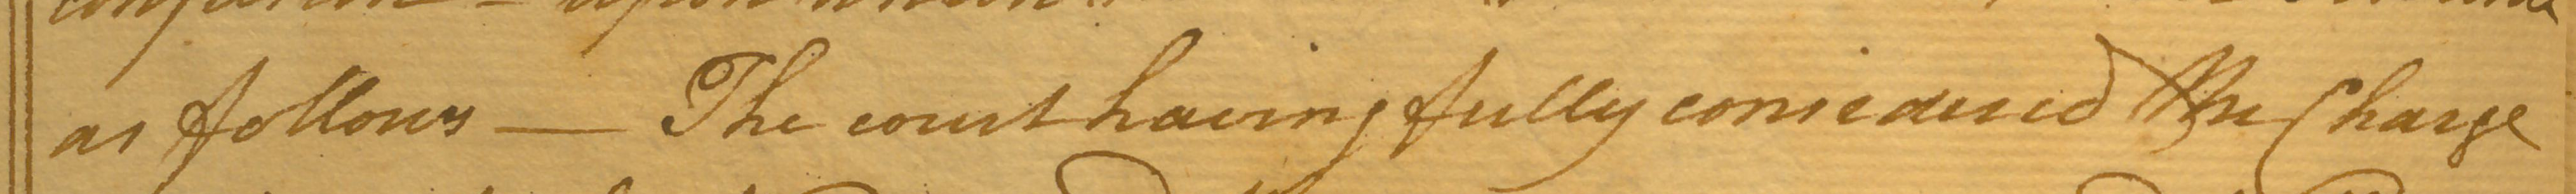as follows- The court having fully considered the Charge
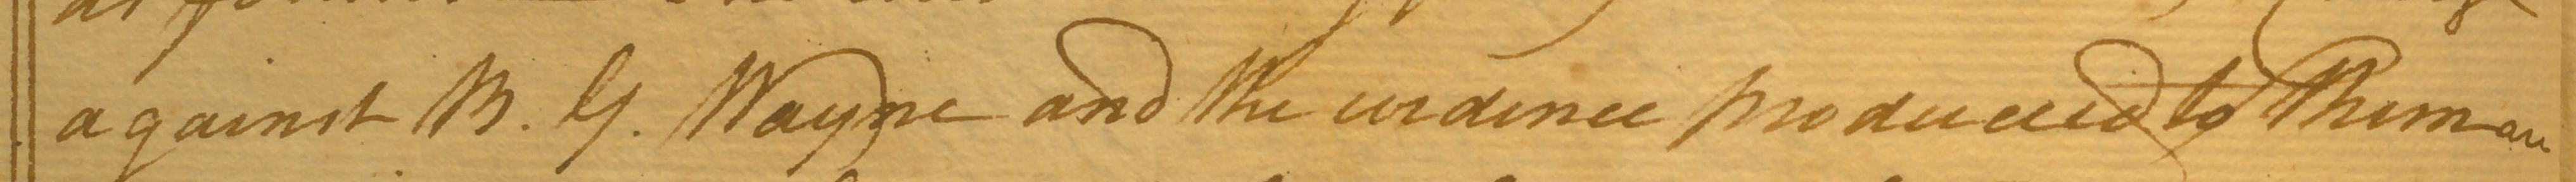against B. G. Wayne and the evidence produced to them as
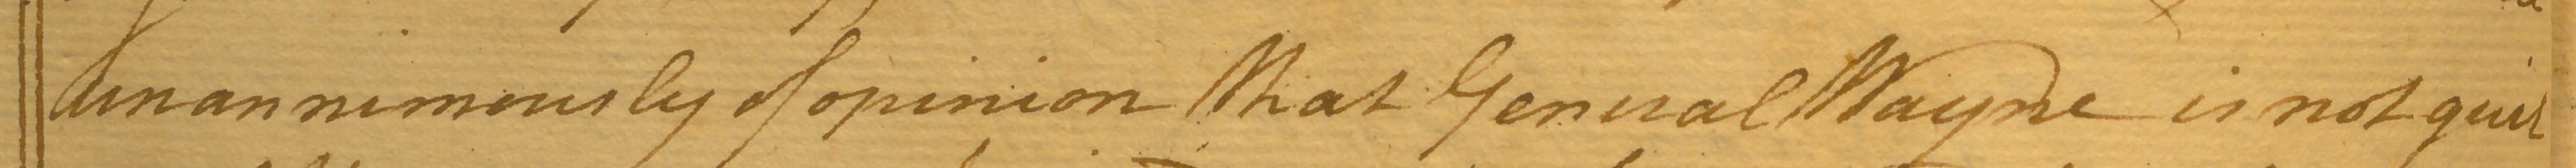unanimously of opinion that General Wayne is not guil
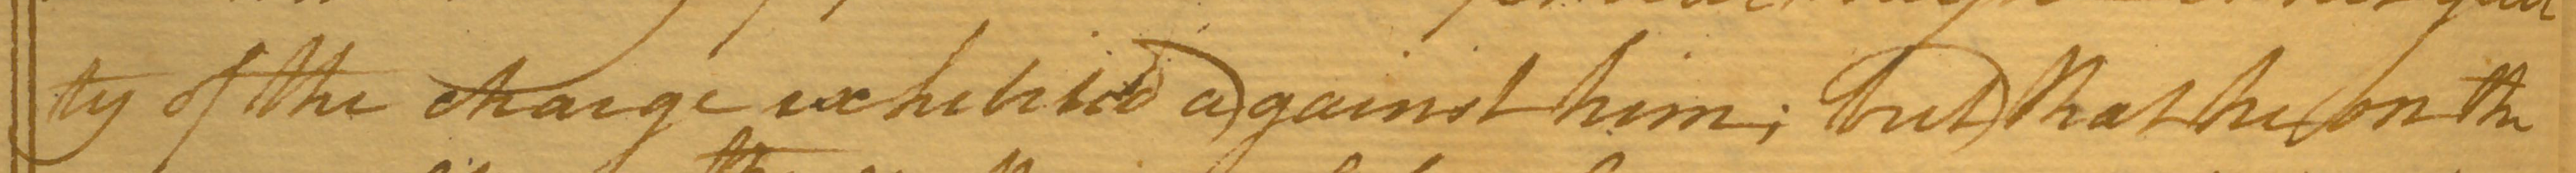ty of the charge exhibited against him; but that he on the
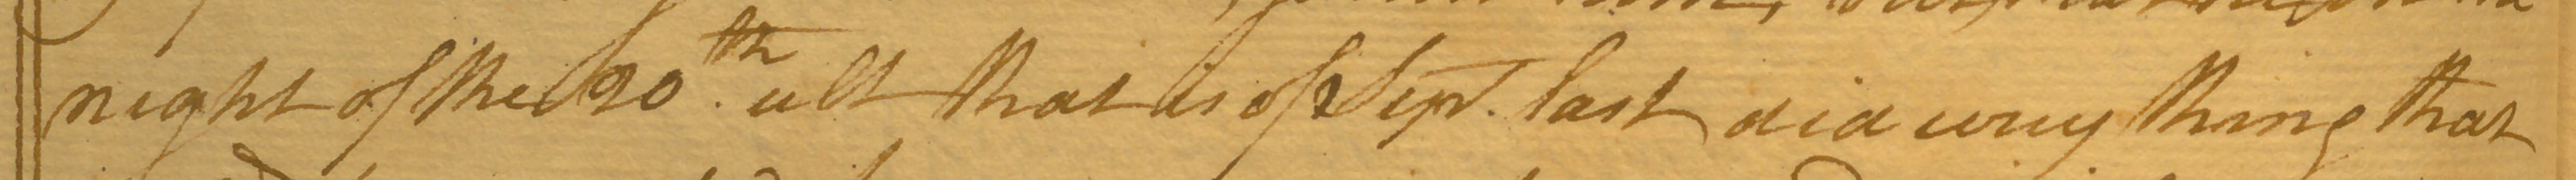night of the 20^th. ult that is of Sept. last did every thing that
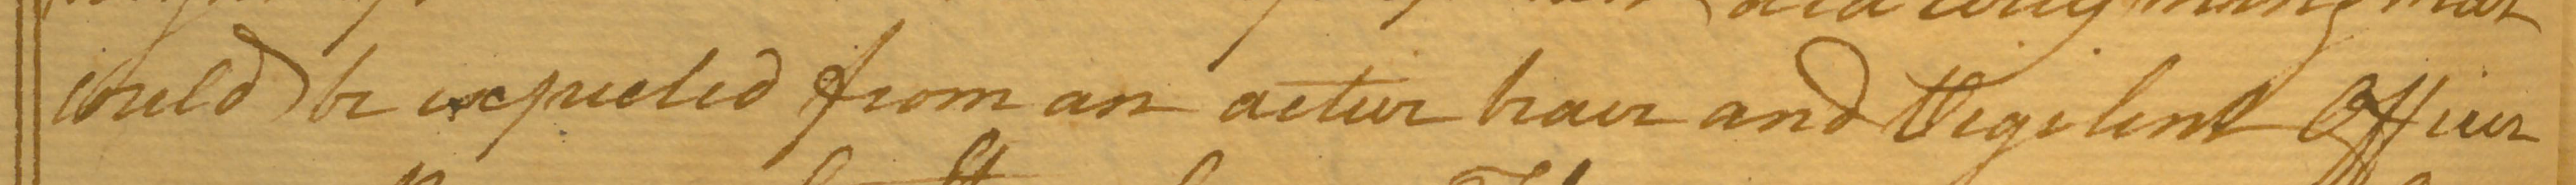could be expected from an active brave and Vigilant Officer
